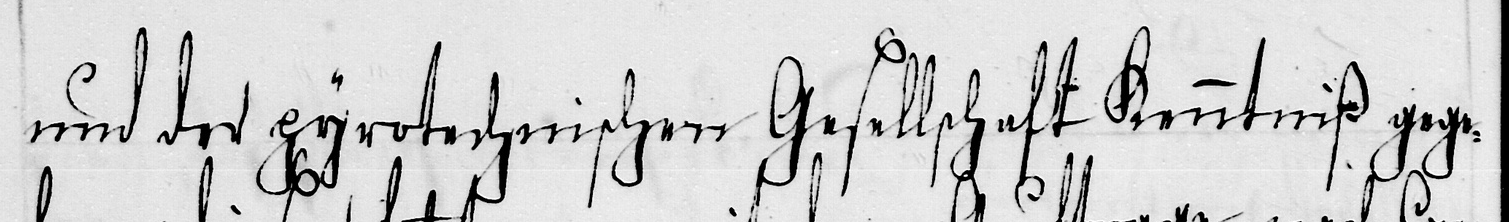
und der pyrotechnischen Gesellschaft Kenntniß geg¬
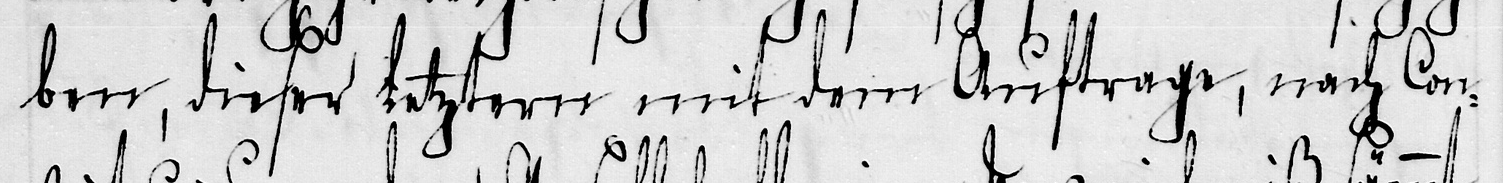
eben, dieser Letztern mit dem Auftrage, nach Con¬
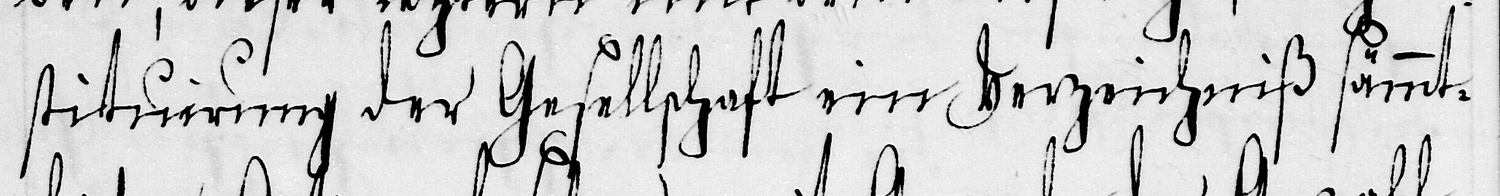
stituirung der Gesellschaft ein Verzeichniß sämmt¬
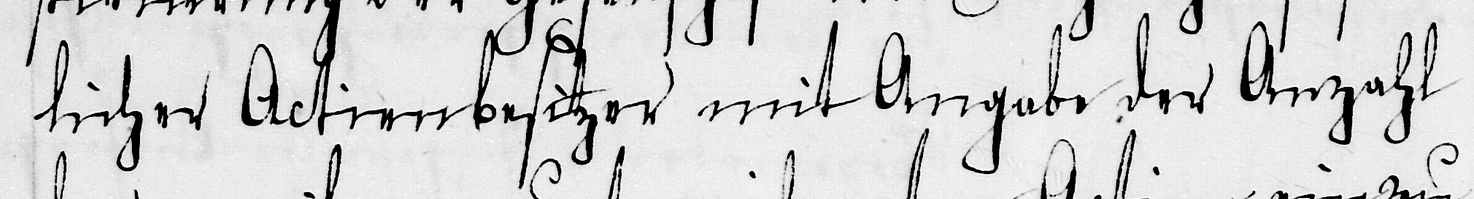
licher Actienbesitzer mit Angabe der Anzahl
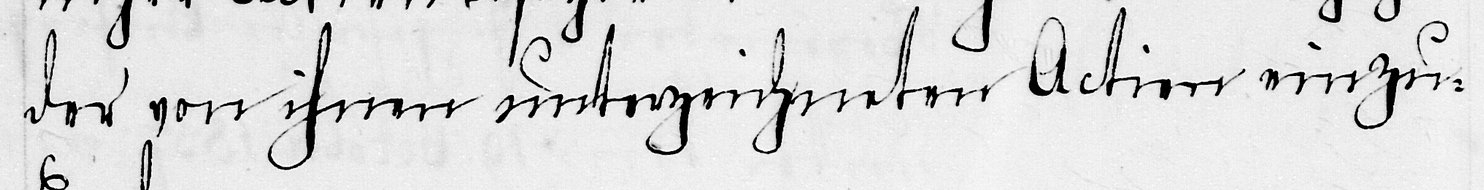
der von ihnen unterzeichneten Actien einzu¬
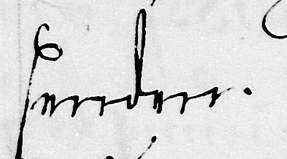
senden.
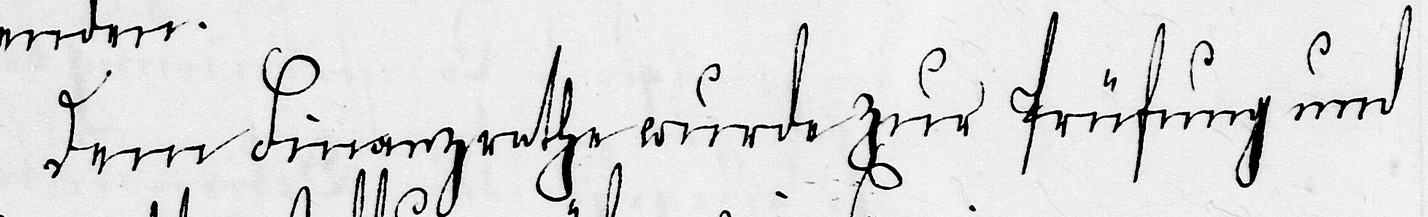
Dem Finanzrathe wurde zur Prüfung und
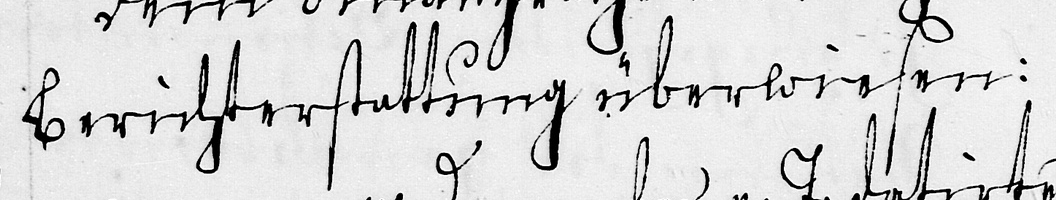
Berichterstattung überwiesen:
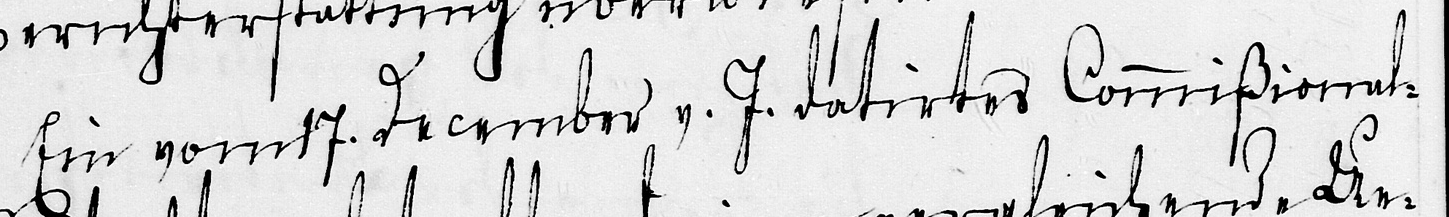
Ein vom 17. December v. J. datirtes Commißiona¬
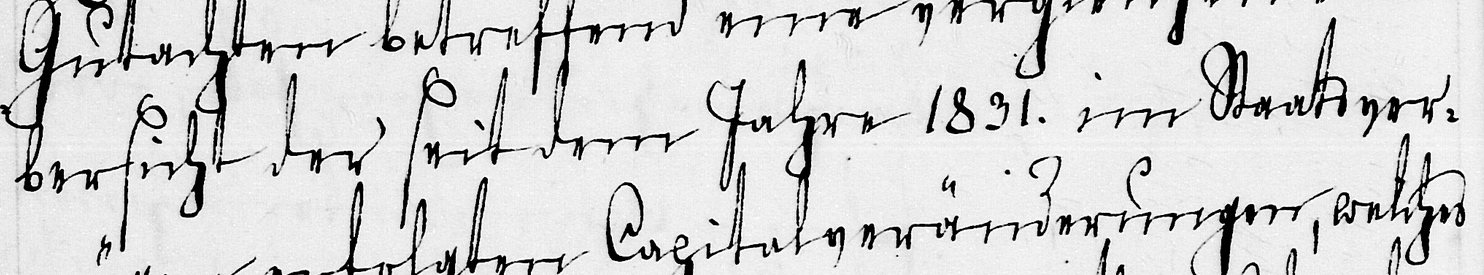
bersicht der seit dem Jahre 1831. im Staatsver¬
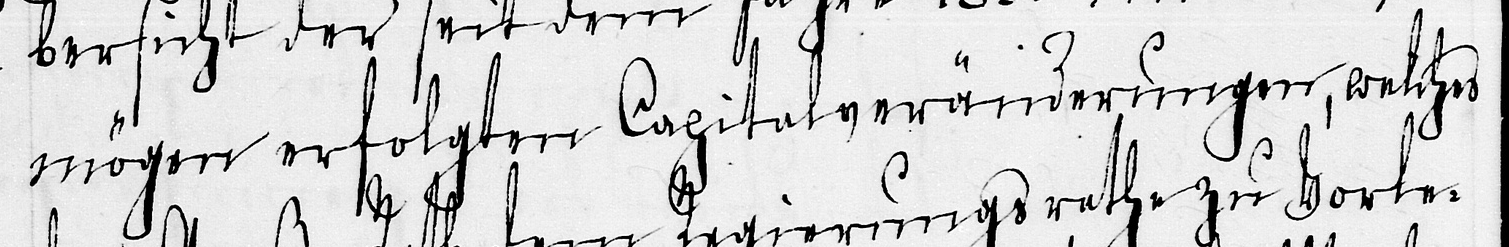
mögen erfolgten Capitalveränderungen, welches
